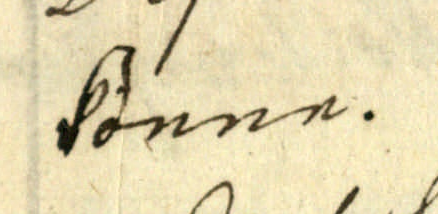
könne.
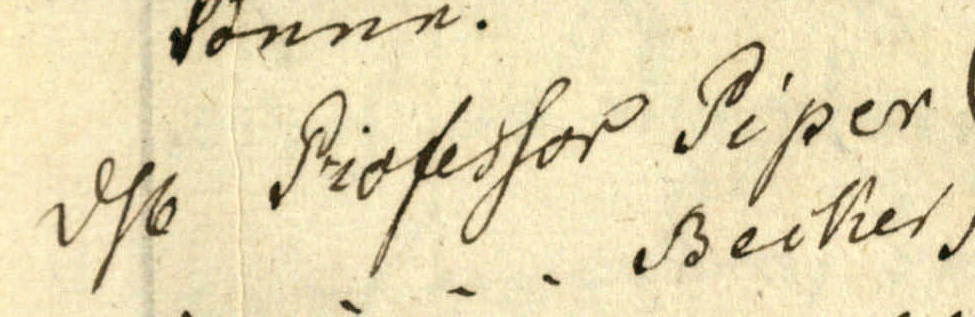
dh Professor Piper
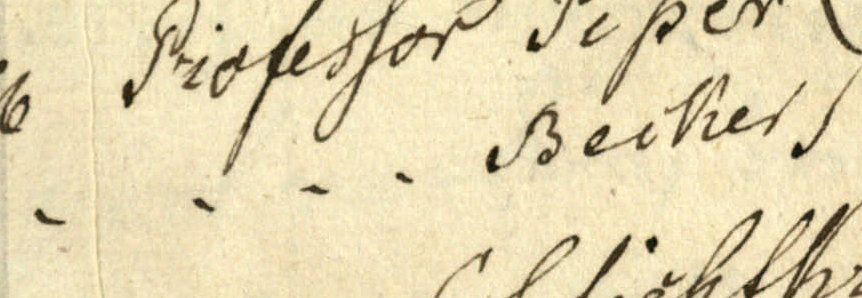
Becker,
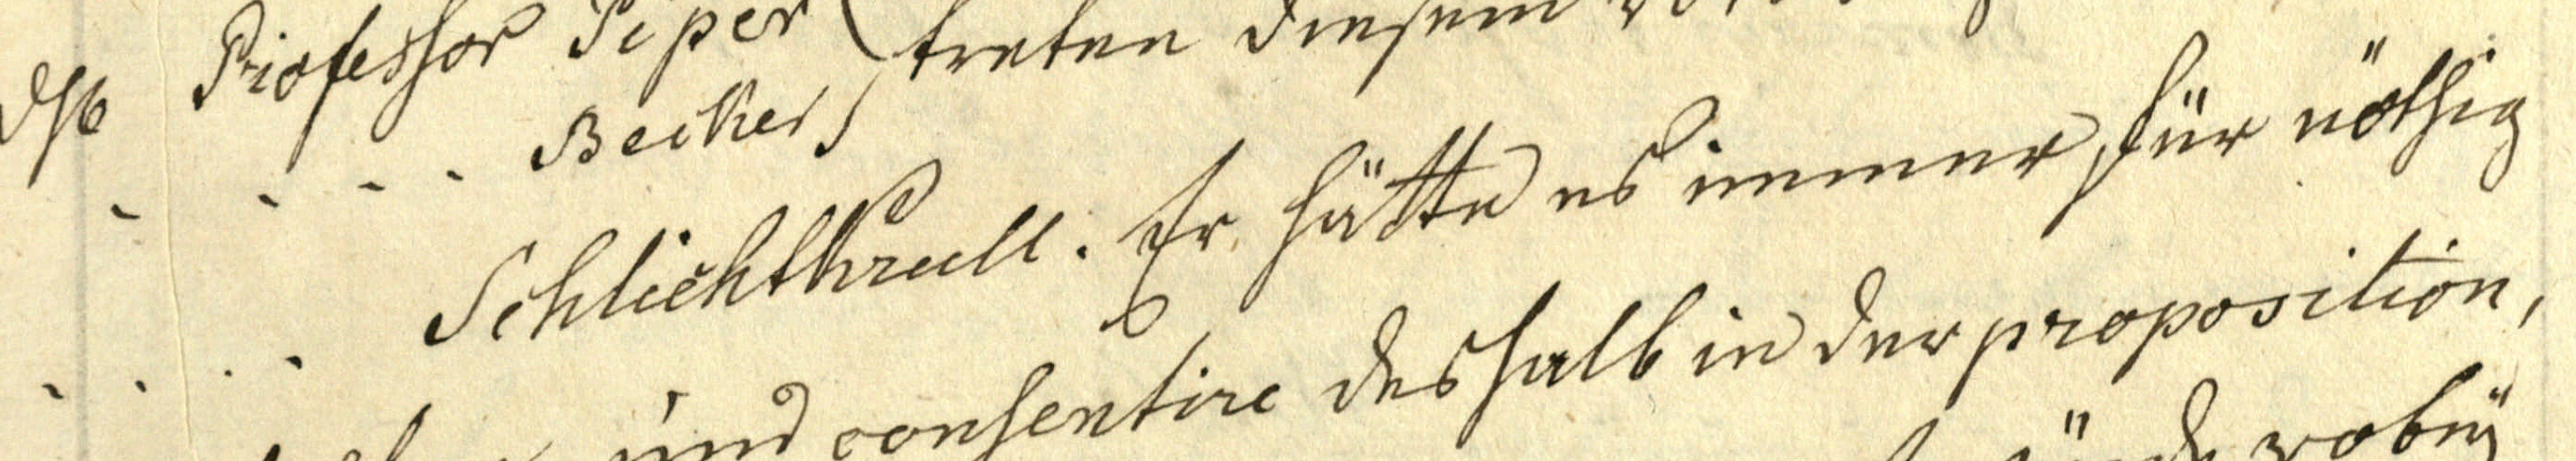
Schlichtkrull. Er hätte es immer für nöthig
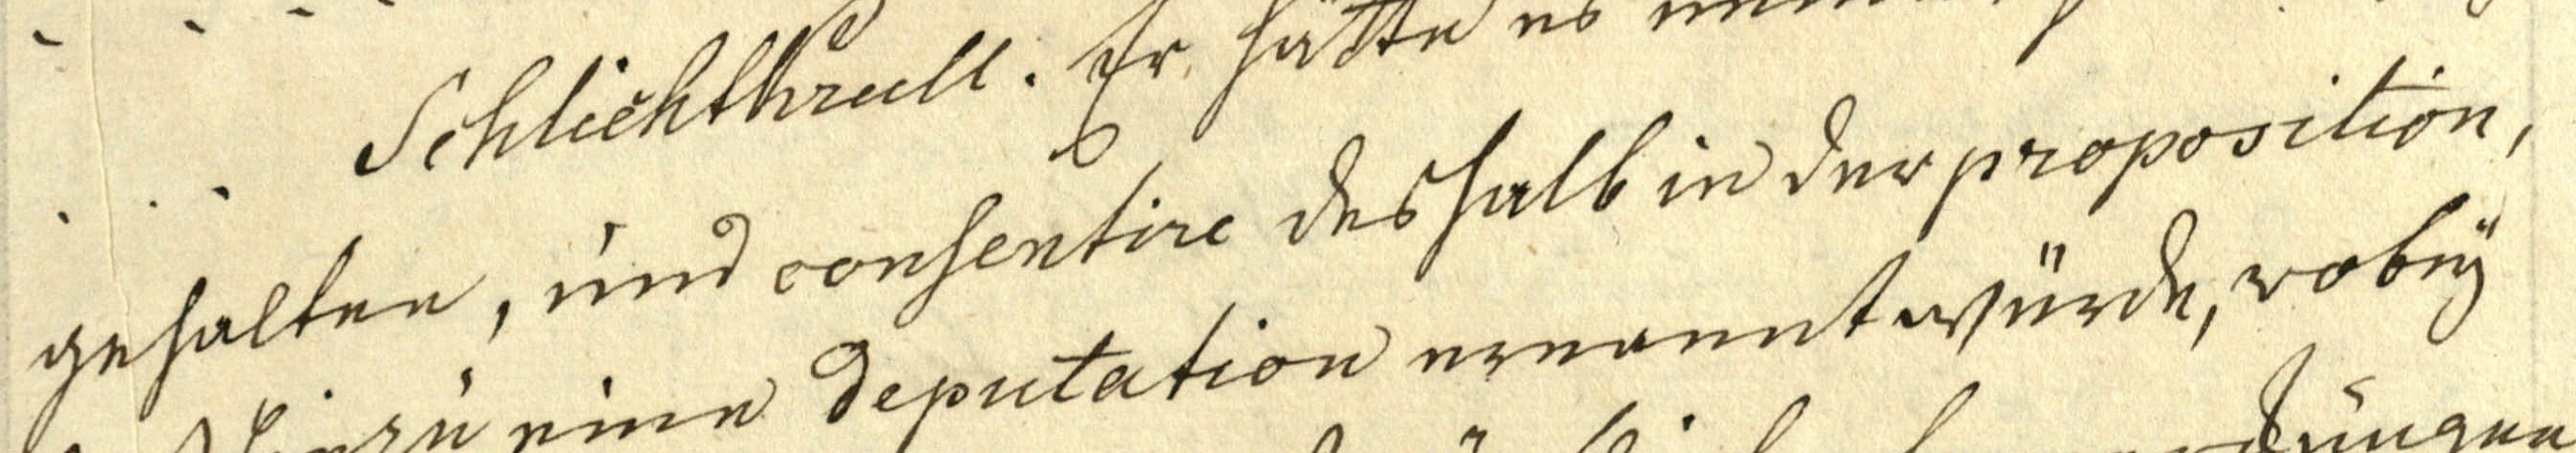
gehalten, und consentire deshalb in der proposition,
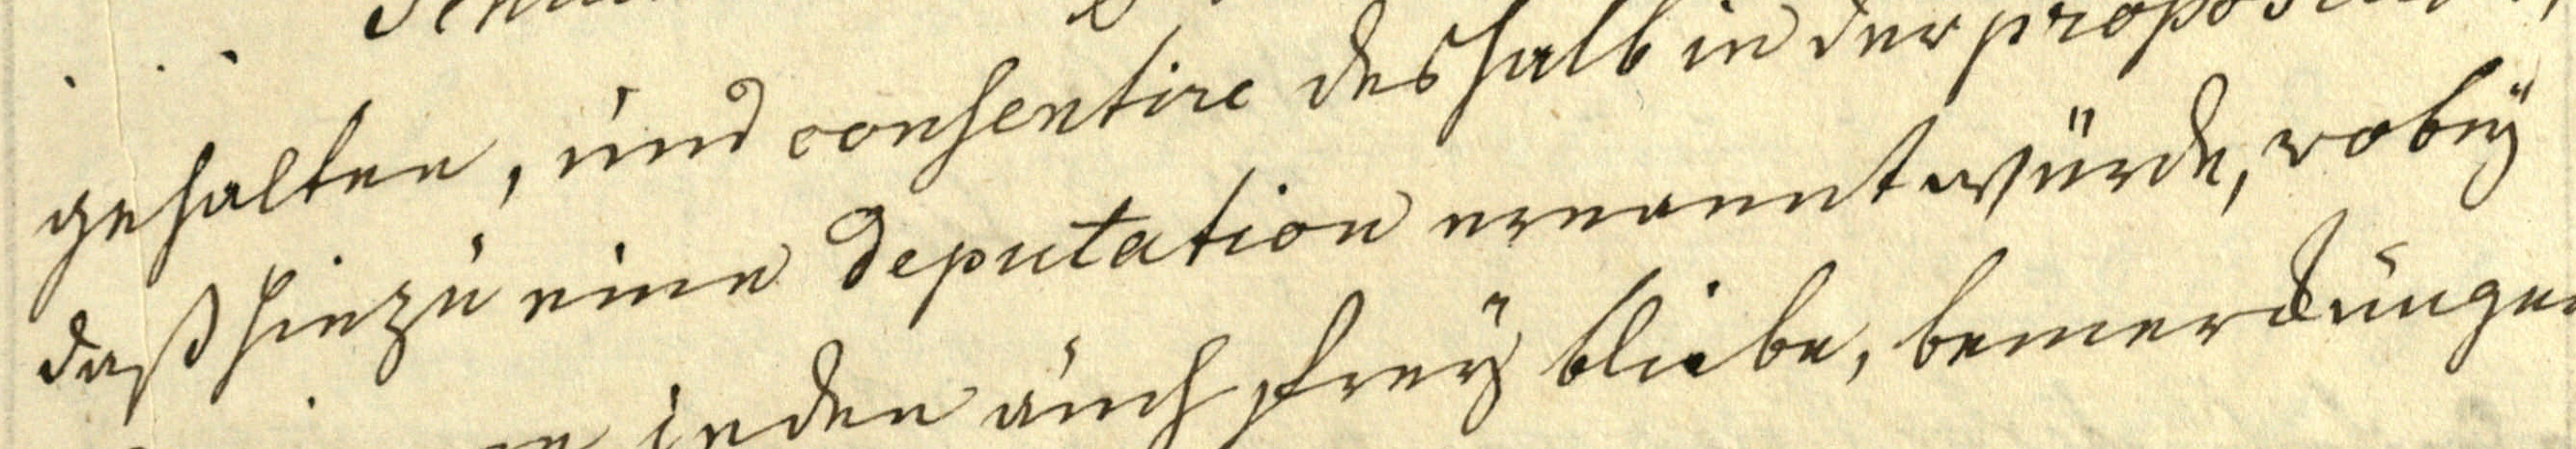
daß hiezu eine deputation ernannt würde, wobeÿ
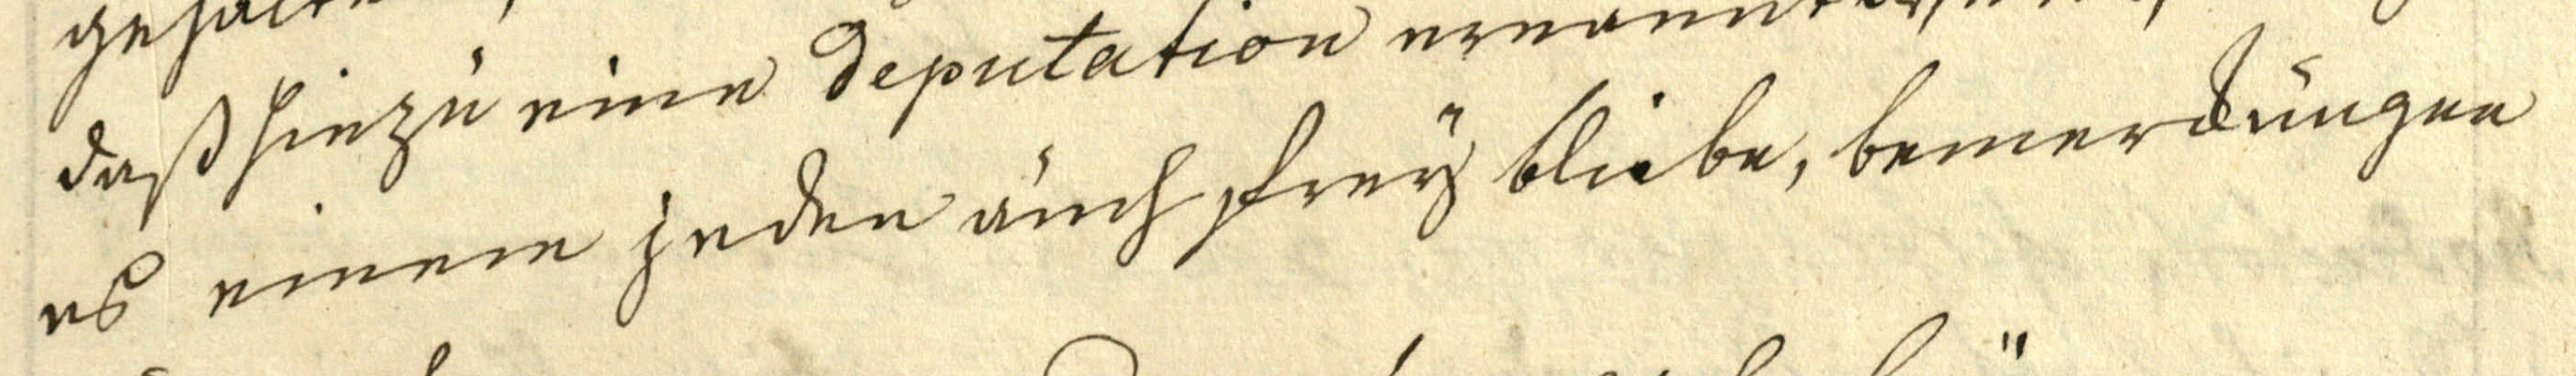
es einem jeden auch freÿ bliebe, Bemerkungen
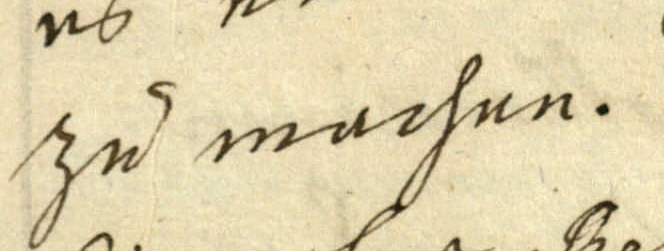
zu machen.
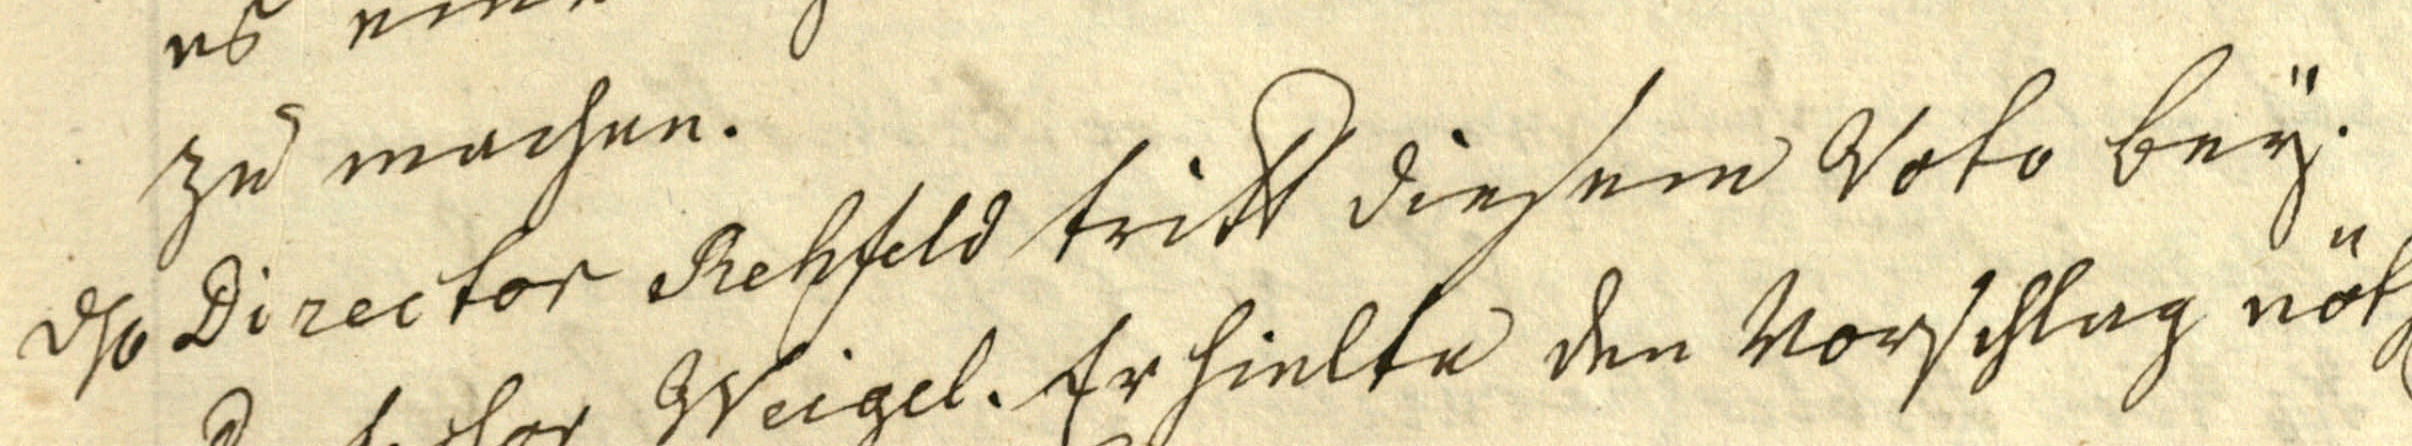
dh Director Rehfeld tritt diesem Voto beÿ.
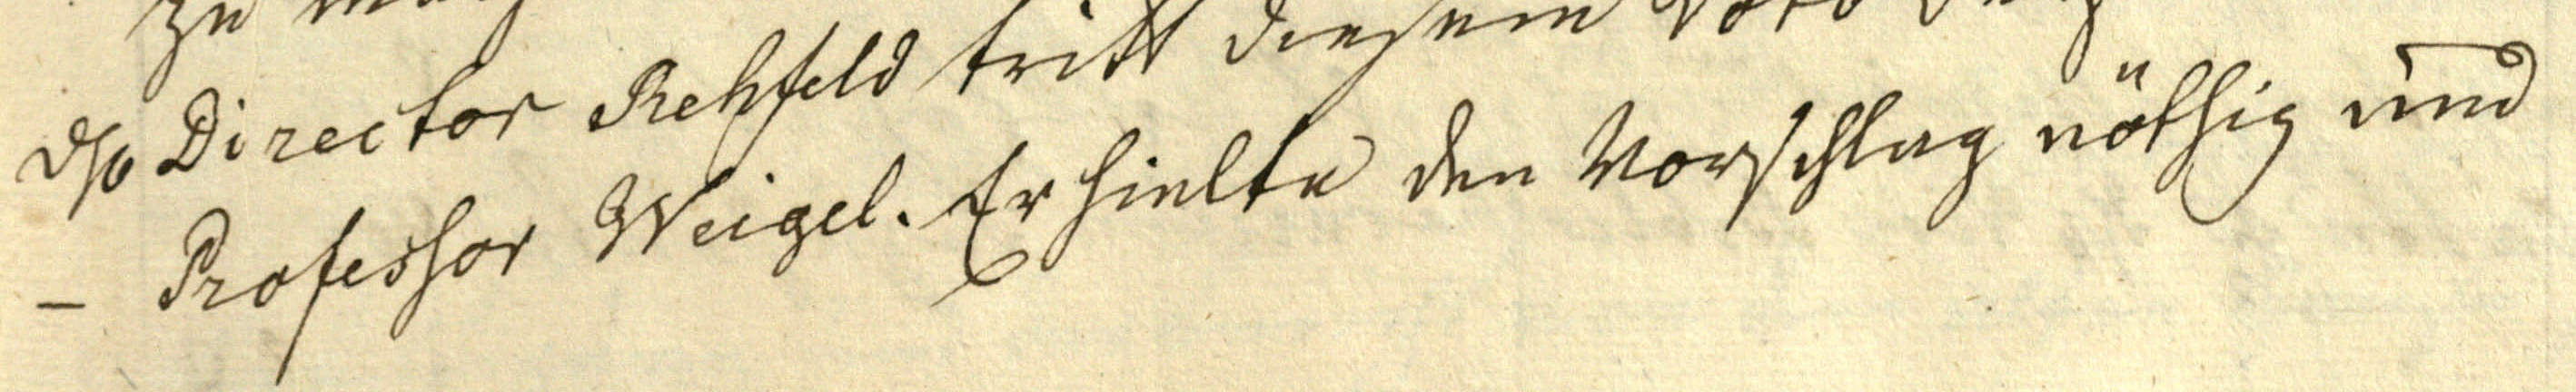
Professor Weigel. Er hielte den Vorschlag nöthig und
